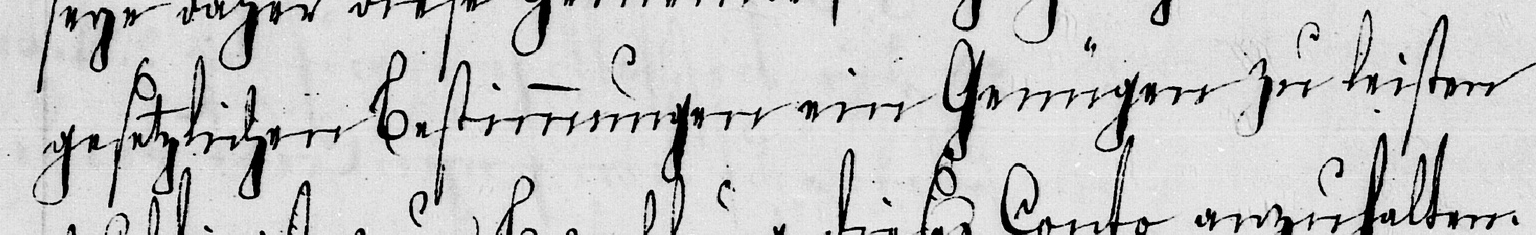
gesetzlichen Bestimmungen ein Genügen zu leisten
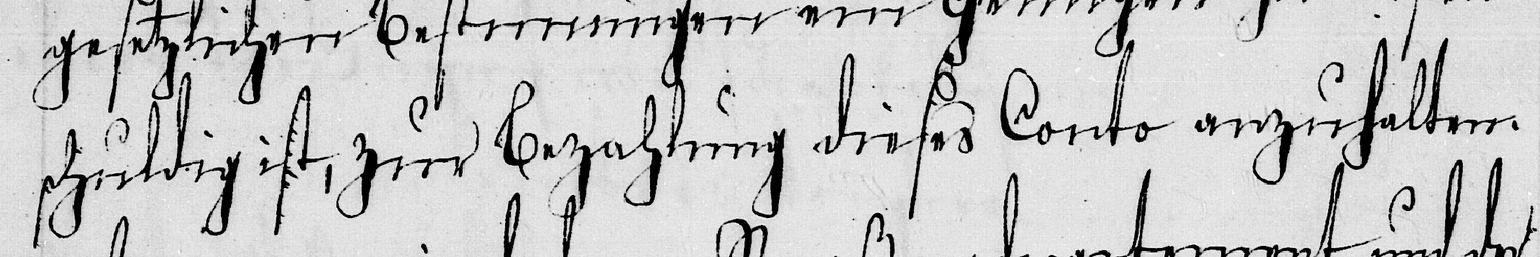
schuldig ist, zur Bezahlung dieses Conto anzuhalten.
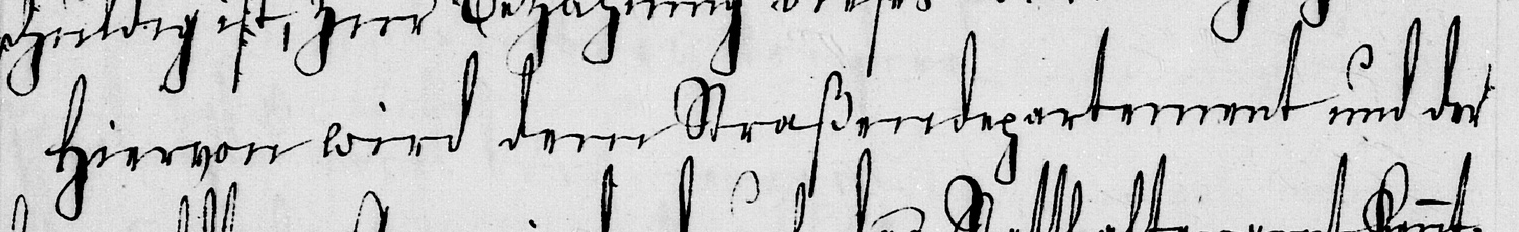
Hiervon wird dem Straßendepartement und der
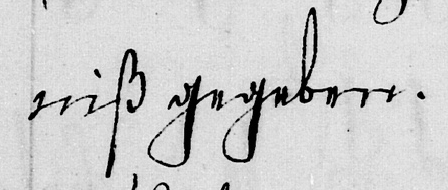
tniß gegeben.
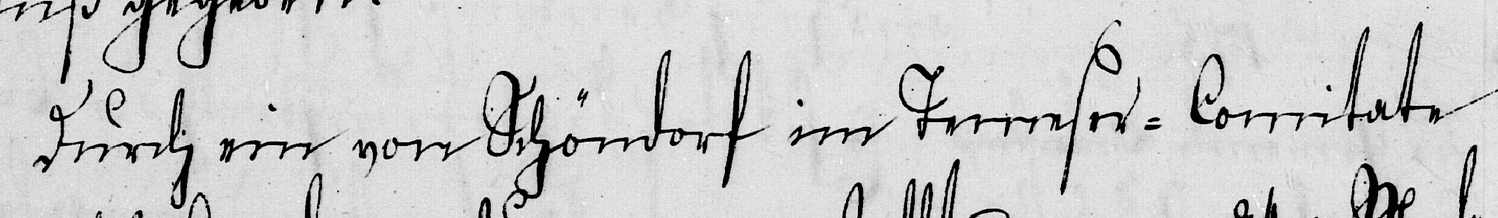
Durch ein von Schöndorf im Temeser-Comitate
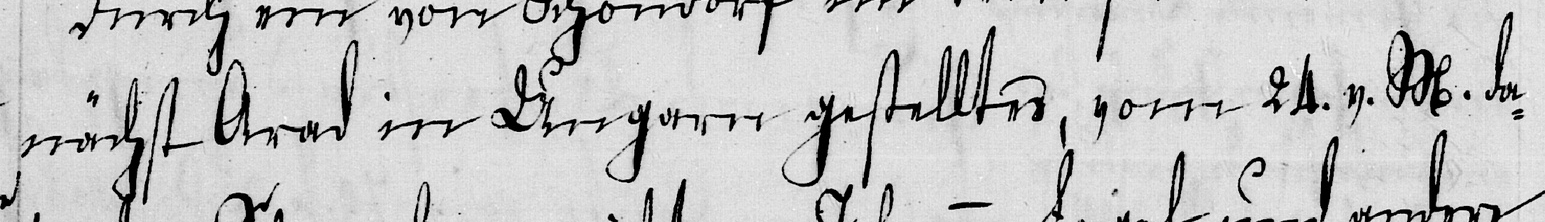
nächst Arad in Ungarn gestelltes, vom 24. v. M. d¬
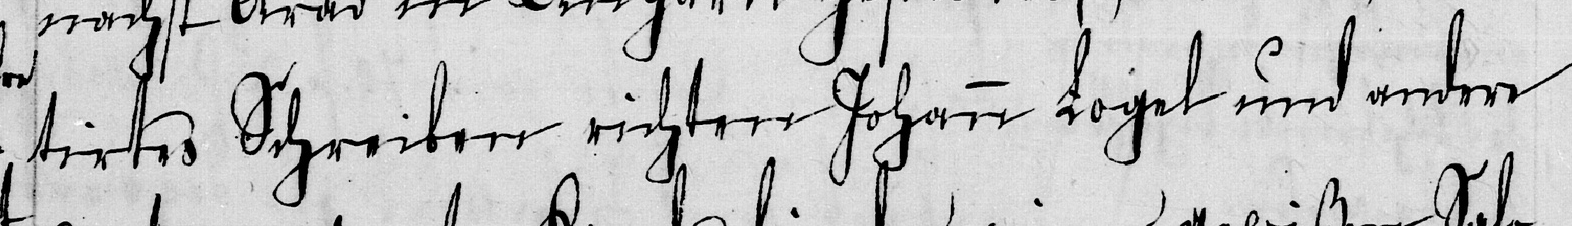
atirtes Schreiben richten Johann Logel und andere
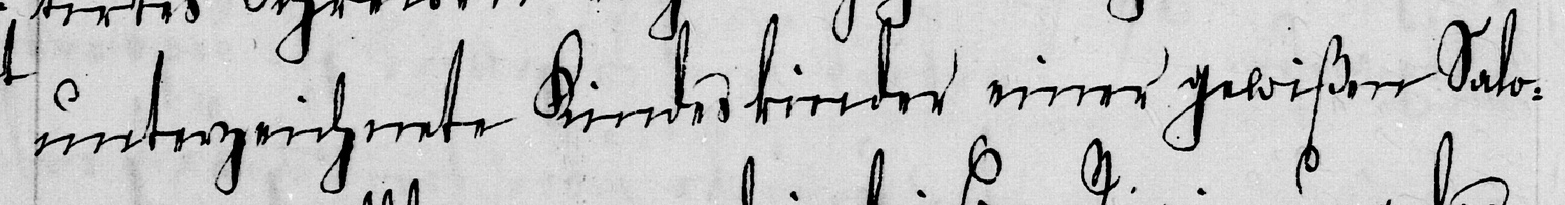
unterzeichnete Kindeskinder einer gewißen Salo¬
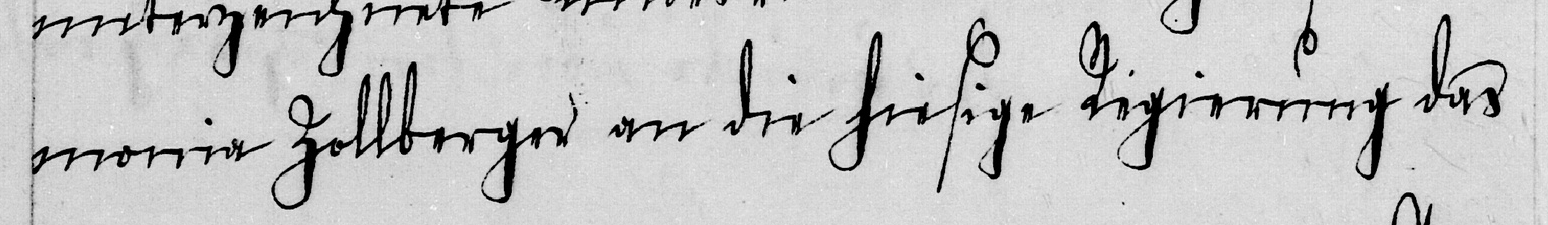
monia Zollberger an die hiesige Regierung das
